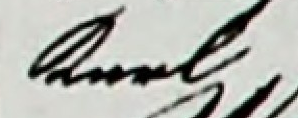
Karl
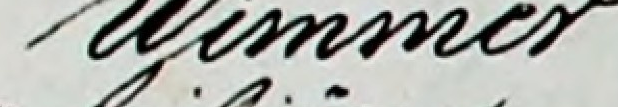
Wimmer
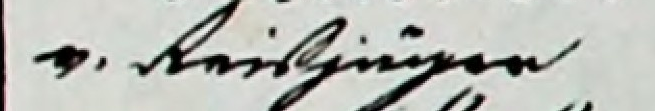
v. Reisjäger
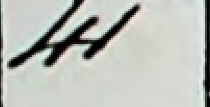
41
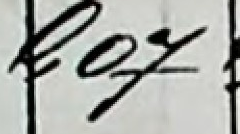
0,07
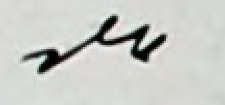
Do
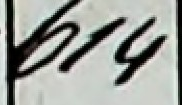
614
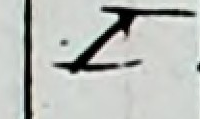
I
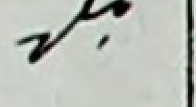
Do
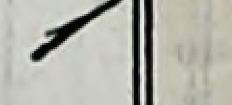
1
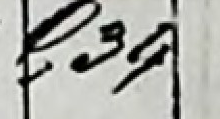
0,34
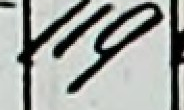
119
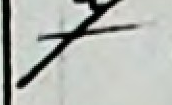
7
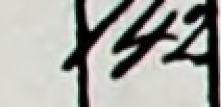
142
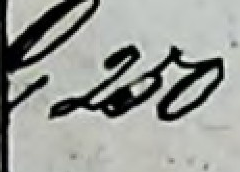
0,250
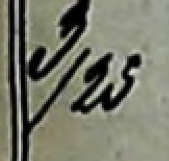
3,25
